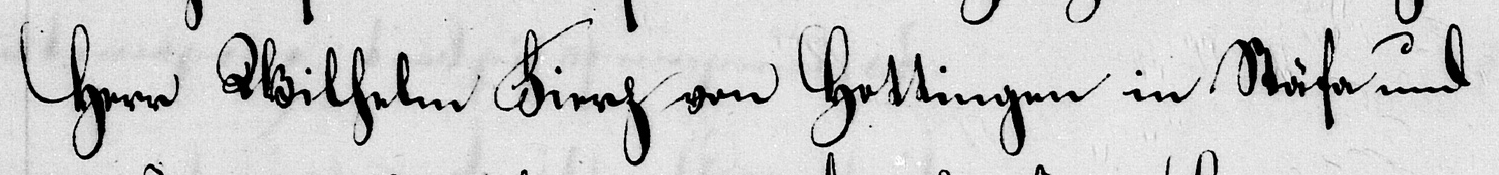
Herr Wilhelm Fierz von Hottingen in Stäfa und
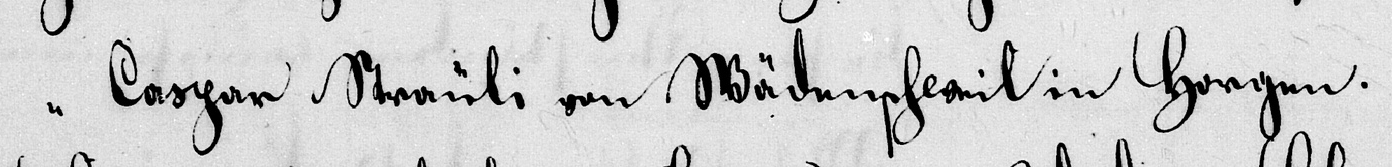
Caspar Sträuli von Wädenschweil in Horgen.
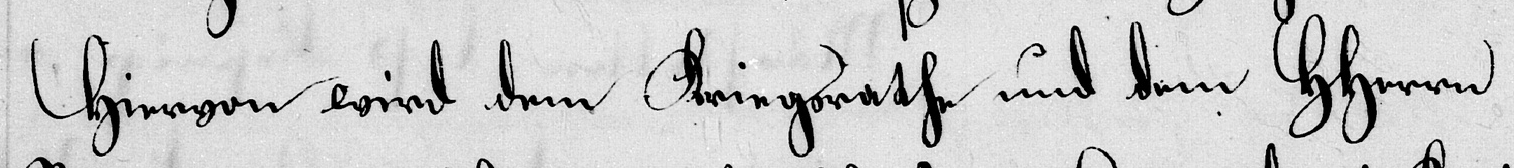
Hiervon wird dem Kriegsrathe und dem HHerrn
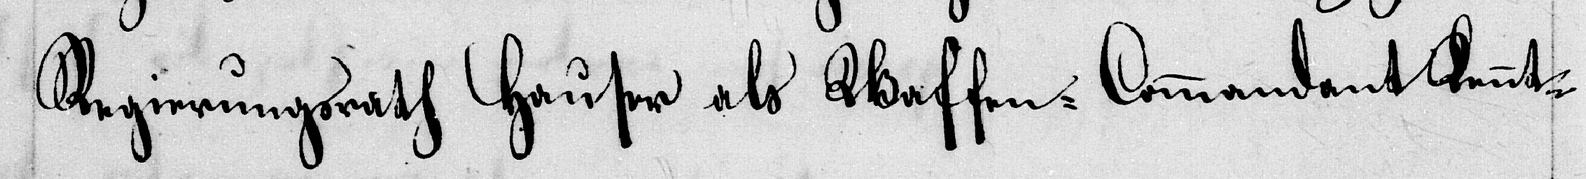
Regierungsrath Hauser als Waffen-Commandant Kennt¬
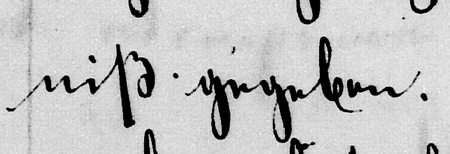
niß gegeben.
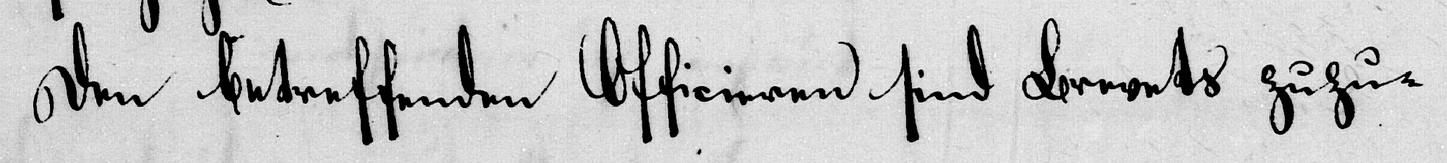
Den betreffenden Officieren sind Brevets zuzu¬
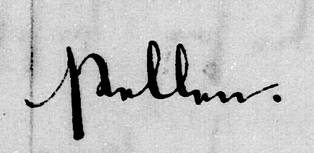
stellen.
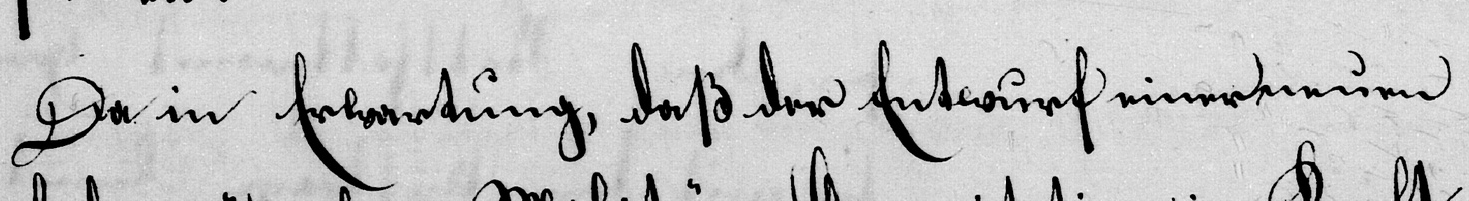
Da in Erwartung, daß der Entwurf einer neuen
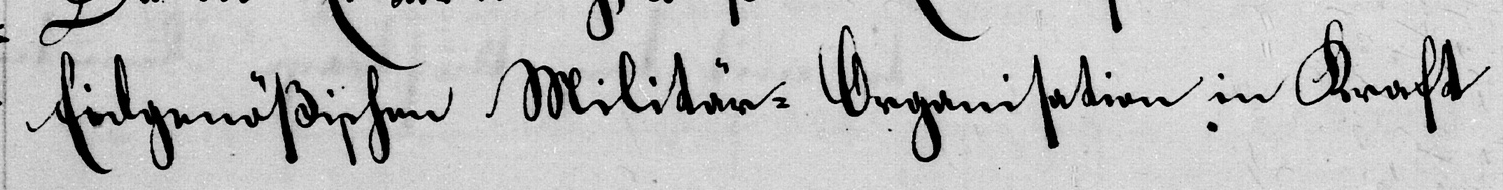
Eidgenößischen Militär-Organisation in Kraft
